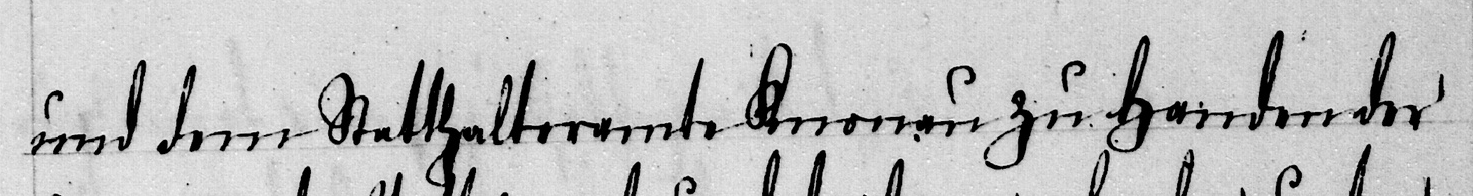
und dem Statthalteramte Knonau zu Handen der
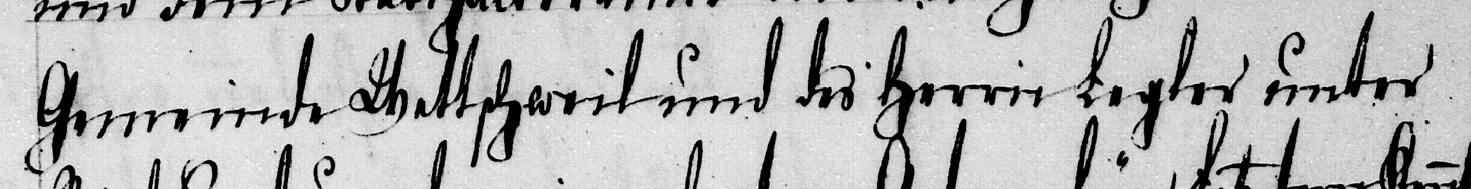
Gemeinde Wettschweil und des Herrn Legler unter
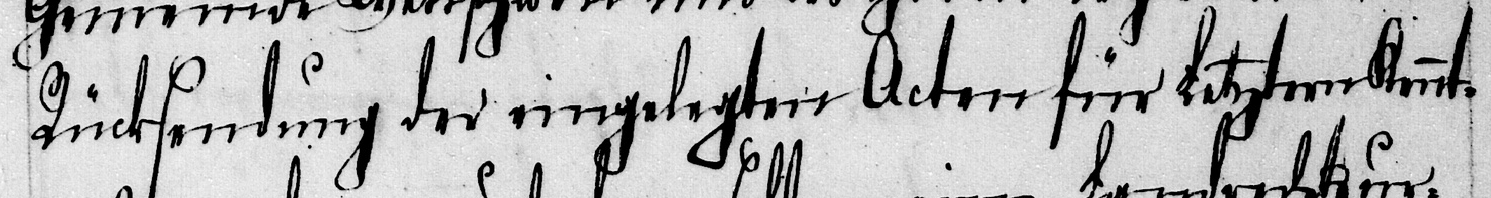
Rücksendung der eingelegten Acten für Letztern Ken¬
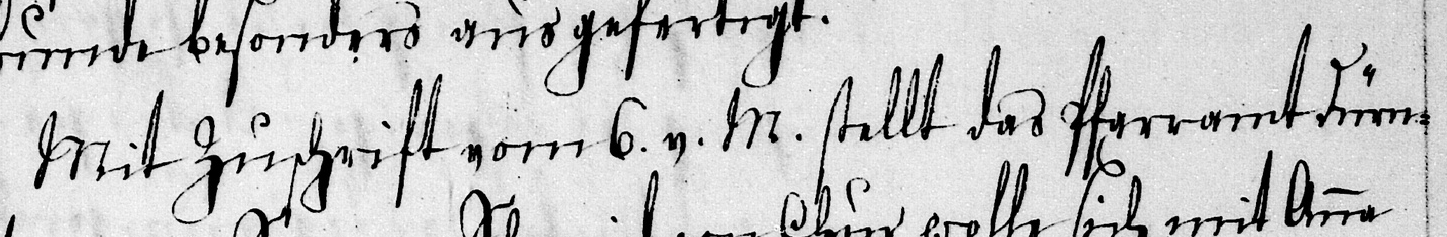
Mit Zuschrift vom 6. v. M. stellt das Pfarramt Dürn¬
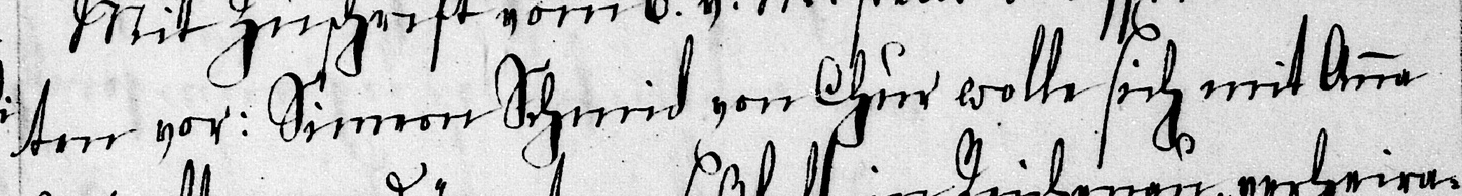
ten vor: Simon Schmid von Chur wolle sich mit Anna
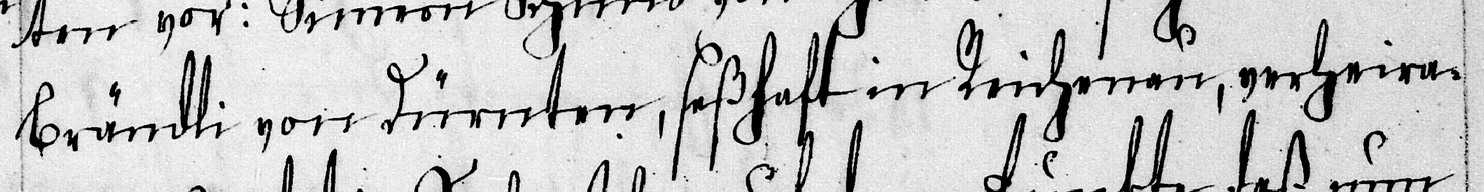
Brändli von Dürnten, seßhaft in Reichenau, verheirat¬
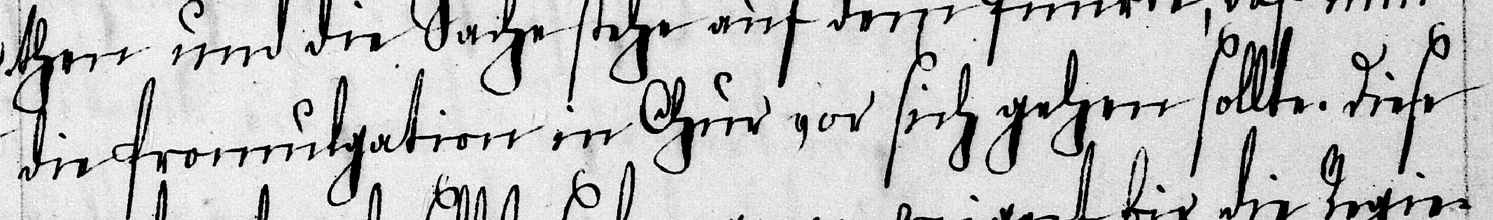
die Promulgation in Chur vor sich gehen sollte. Diese
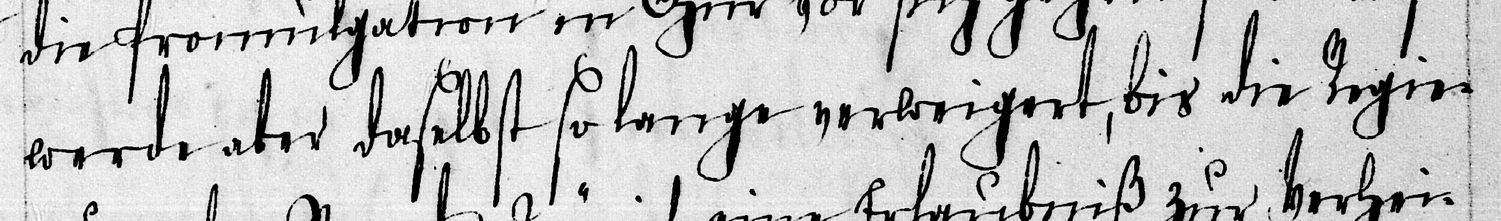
werde aber daselbst so lange verweigert, bis die Regie¬
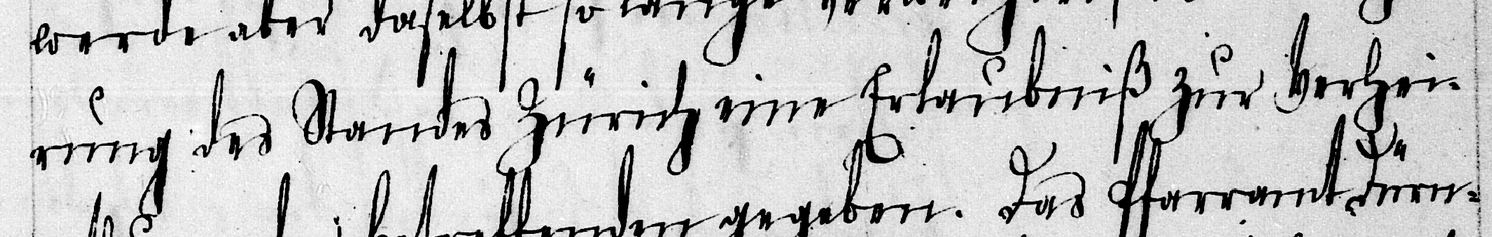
rung des Standes Zürich eine Erlaubniß zur Verhei¬
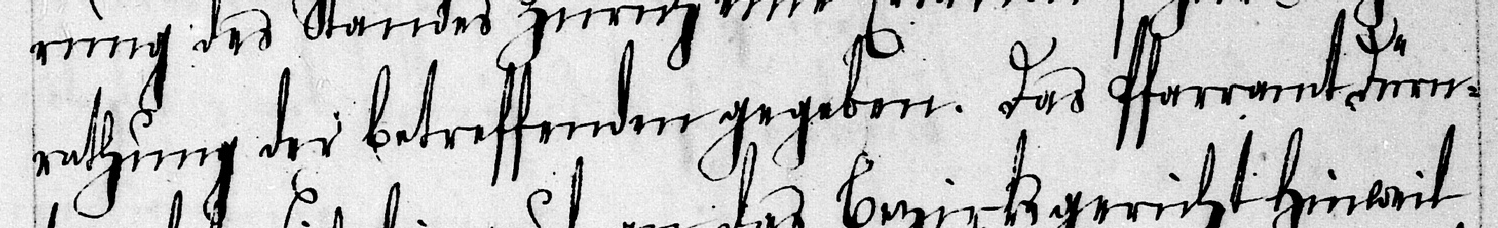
rathung der betreffenden gegeben. Das Pfarramt Dürn¬
